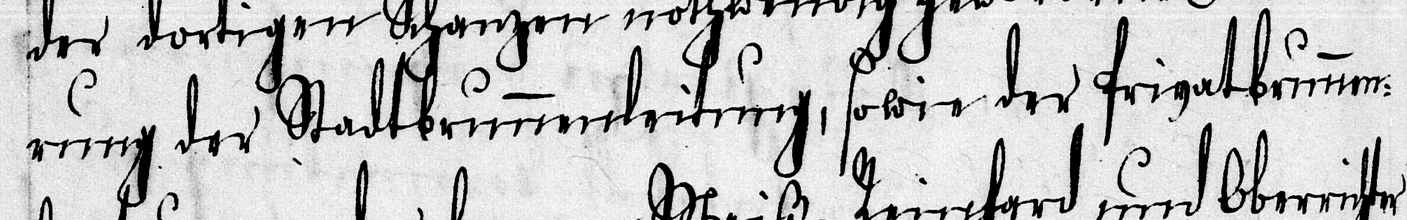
rung der Stadtbrunnenleitung, sowie der Privatbrunnen¬
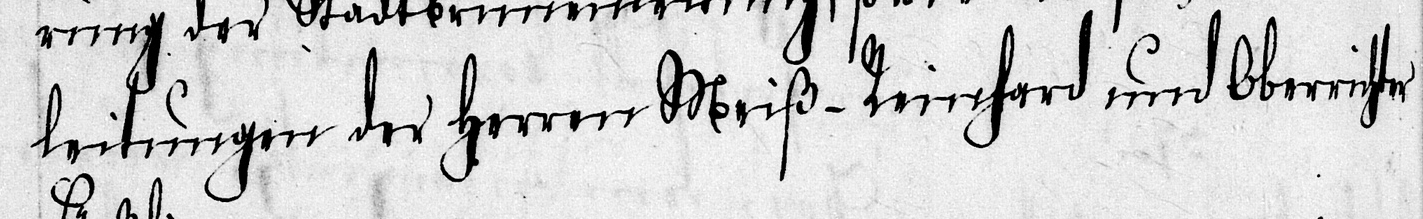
leitungen der Herren Meiß-Reinhard und Oberric¬
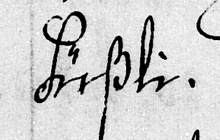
Füßli.
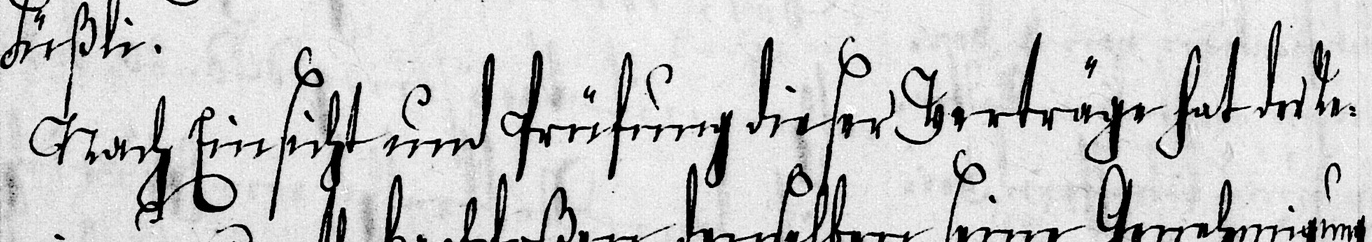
Nach Einsicht und Prüfung dieser Verträge hat der
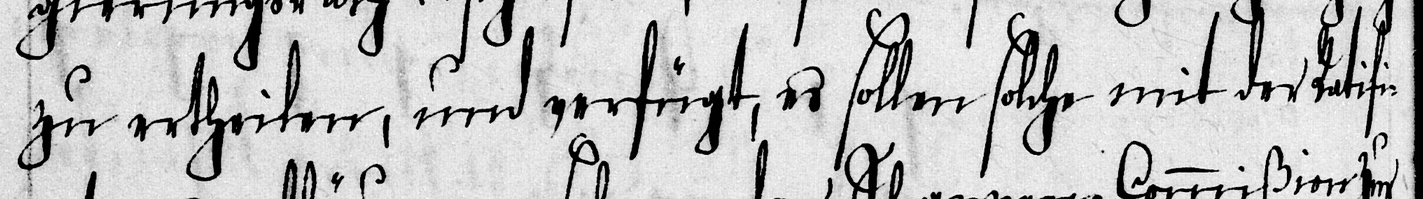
zu ertheilen, und verfügt, es sollen solche mit der Rati¬
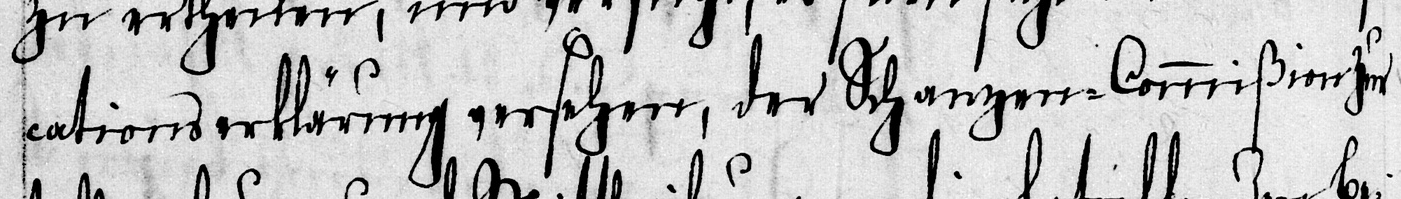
cationserklärung versehen, der Schanzen-Commißion
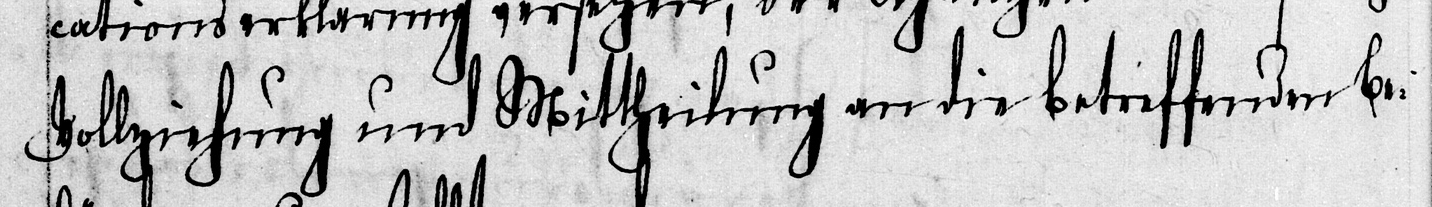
Vollziehung und Mittheilung an die betreffenden Be¬
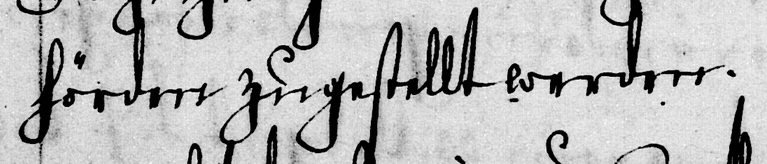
hörden zugestellt werden.
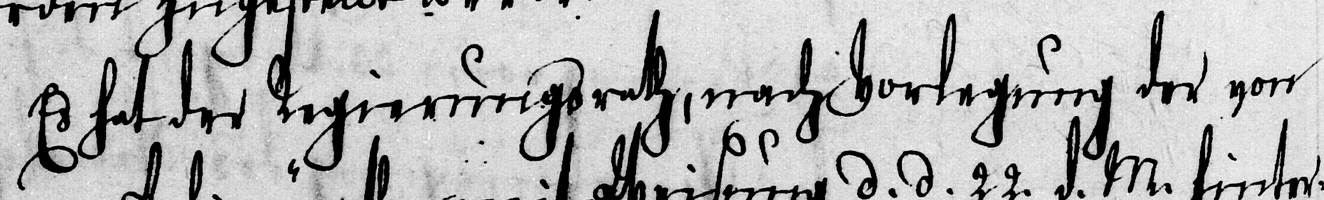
Es hat der Regierungsrath, nach Vorlegung der von
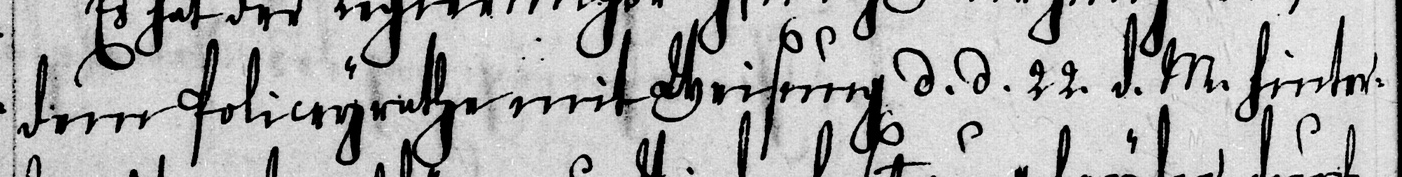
dem Policeyrathe mit Weisung d. d. 22. d. M. hinter¬
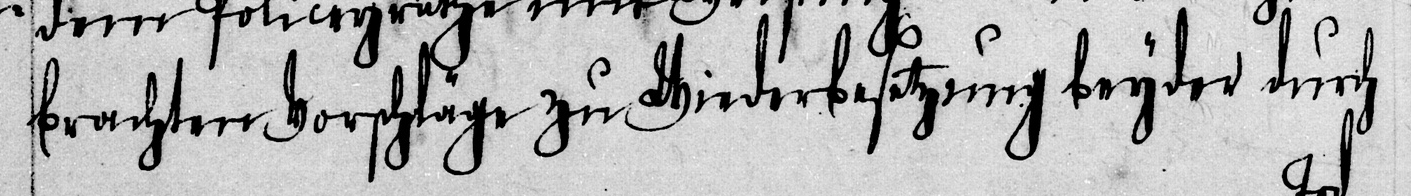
brachten Vorschläge zu Wiederbesetzung beyder durch
